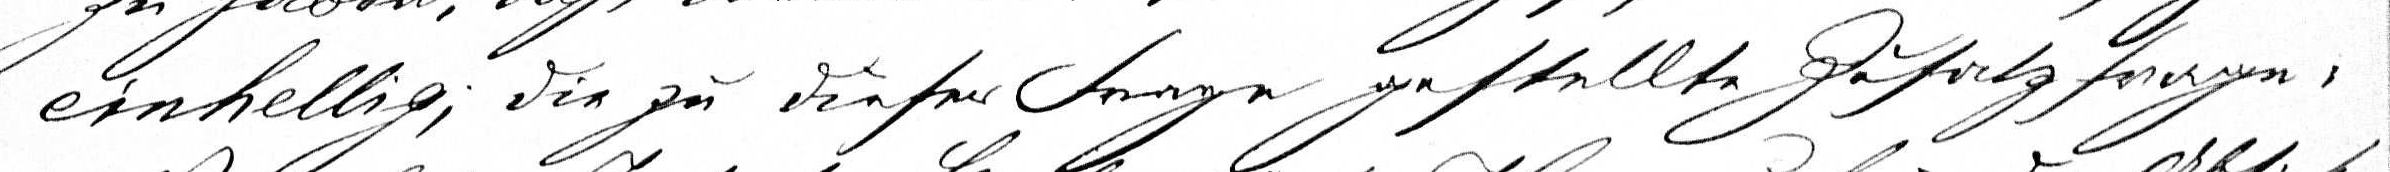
einhellig, die zu dieser Frage gestellte Zusatzfrage,
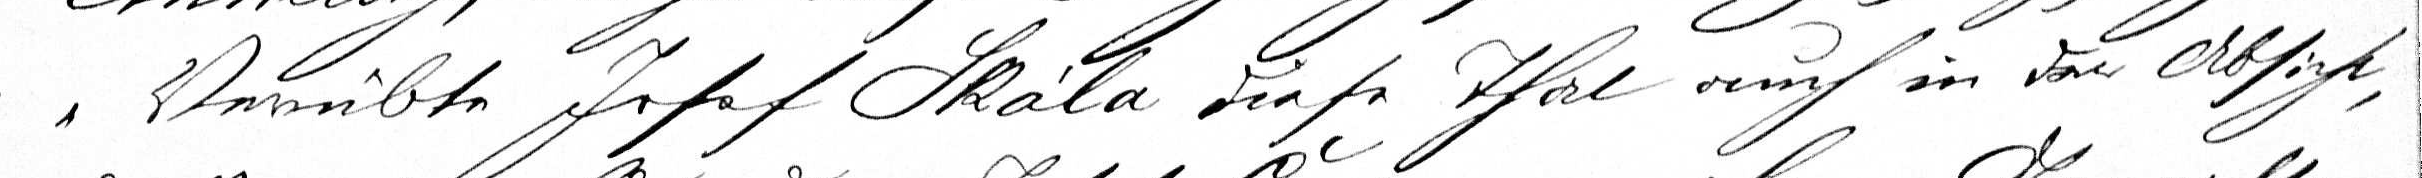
„Verübte Josef Skála diese That auch in der Absicht,
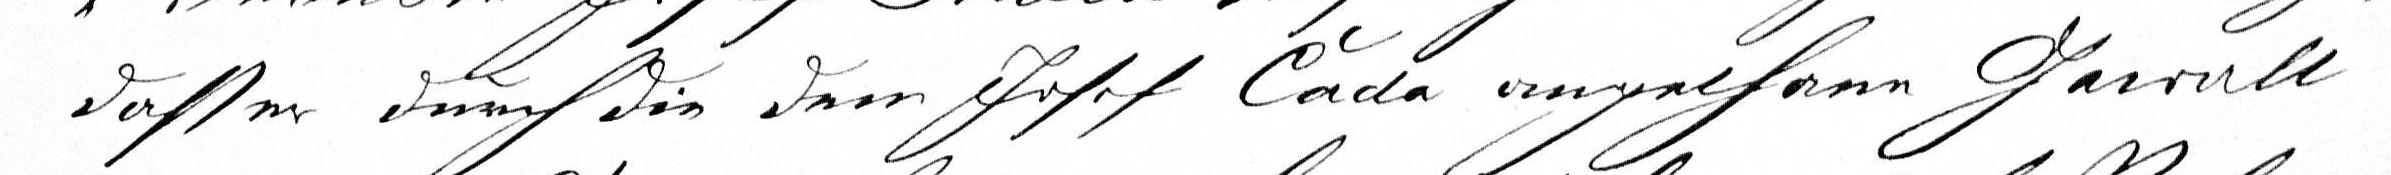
daß er durch die dem Josef Čada angethane Gewalt
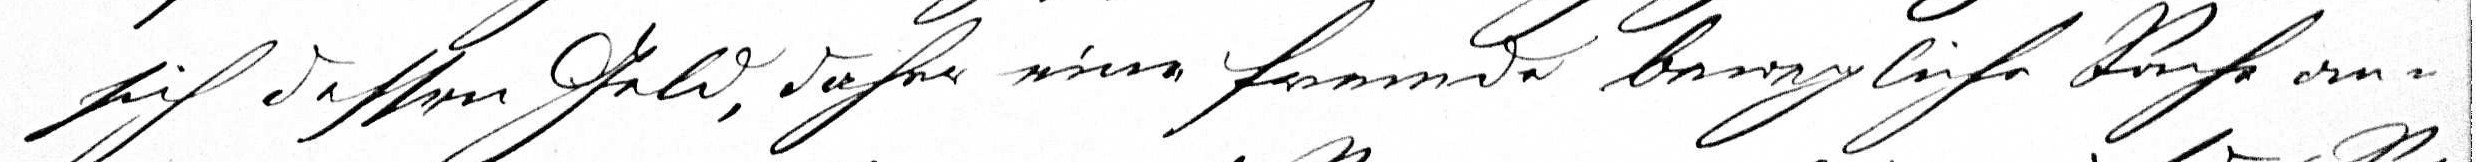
sich dessen Geld, daher eine fremde bewegliche Sache an¬
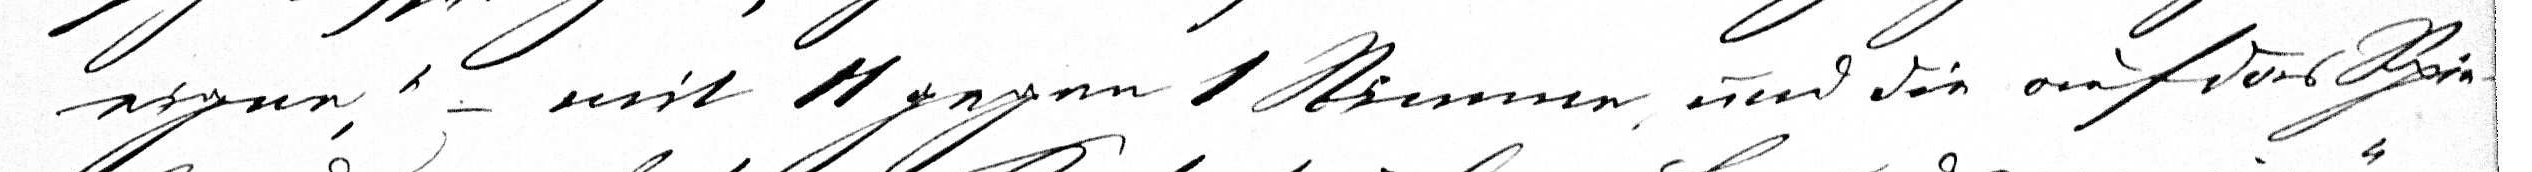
eigne,“ – mit 11 gegen 1 Stimme, und die auf das Spie¬
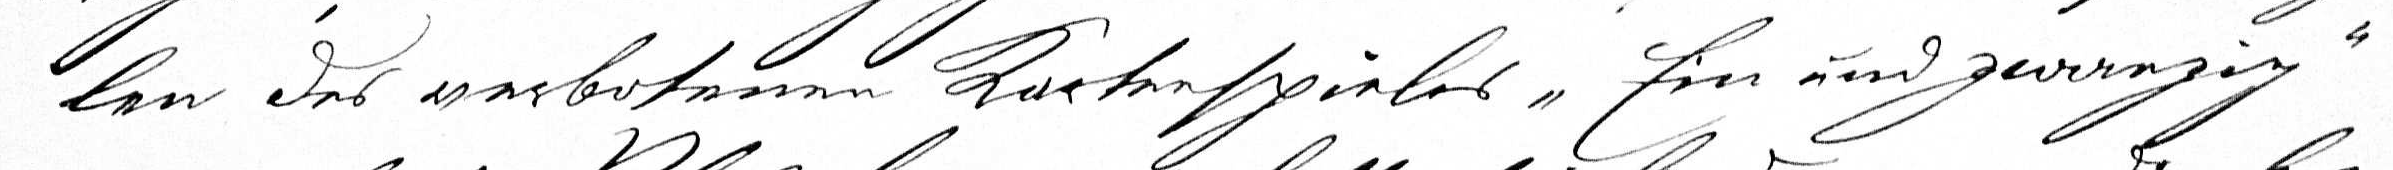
len des verbotenen Kartenspieles „Ein und zwanzig“
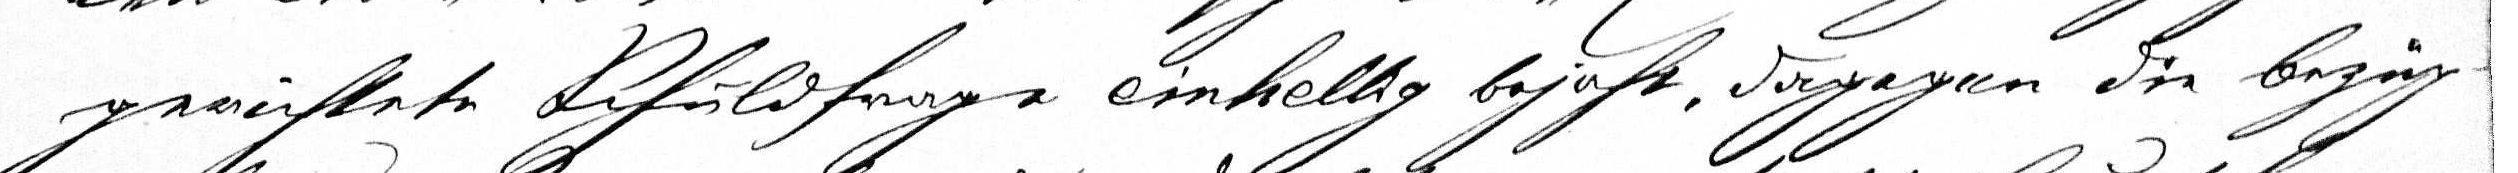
gerichtete Schuldfrage einhellig bejaht, dagegen die bezüg¬
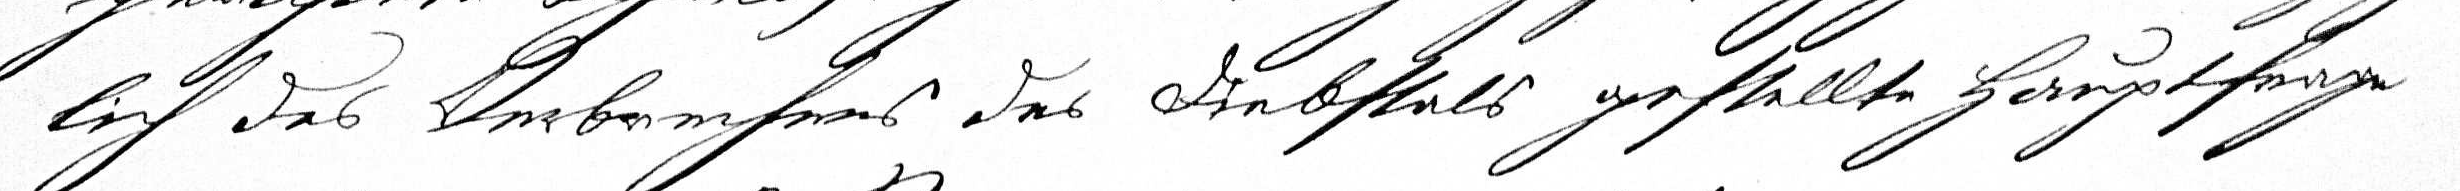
lich des Verbrechens des Diebstals gestellte Hauptfrage
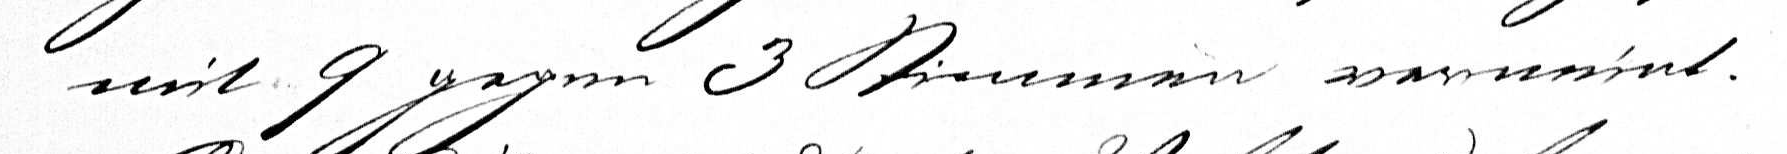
mit 9 gegen 3 Stimmen verneint.
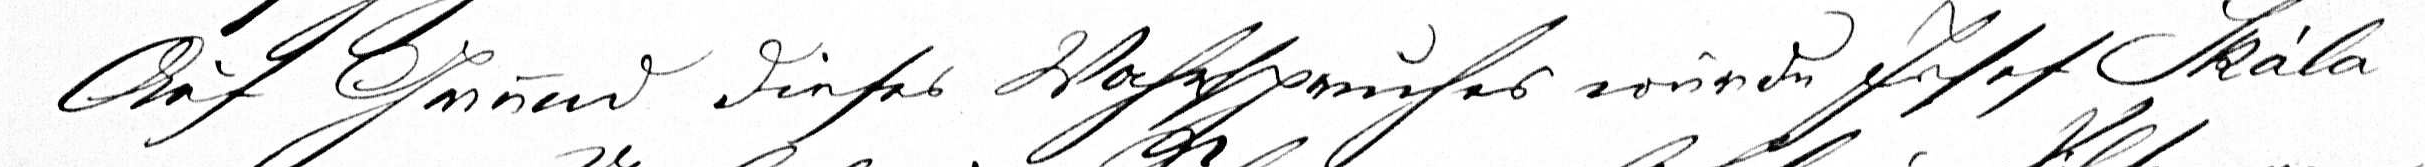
Auf Grund dieses Wahrspruches wurde Josef Skála
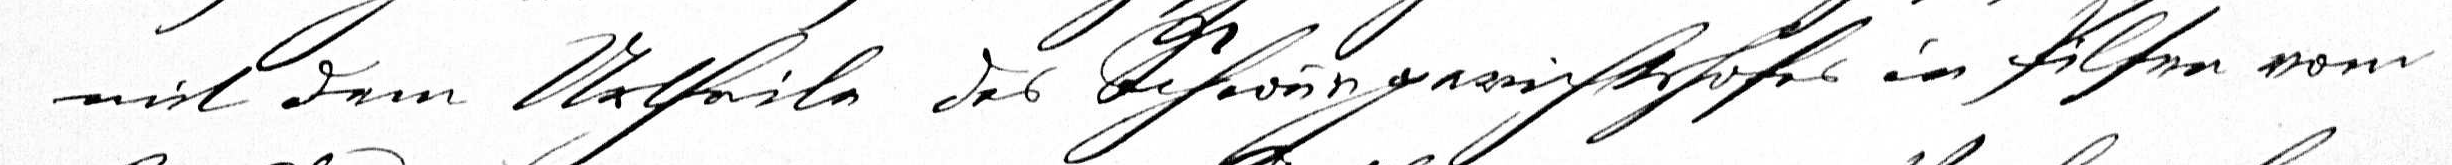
mit dem Urtheile des Schwurgerichtshofes in Pilsen vom
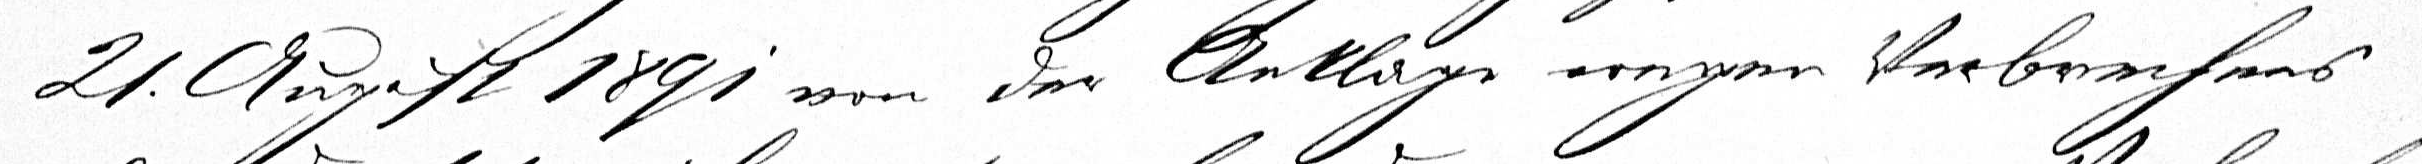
21. August 1891 von der Anklage wegen Verbrehcnes
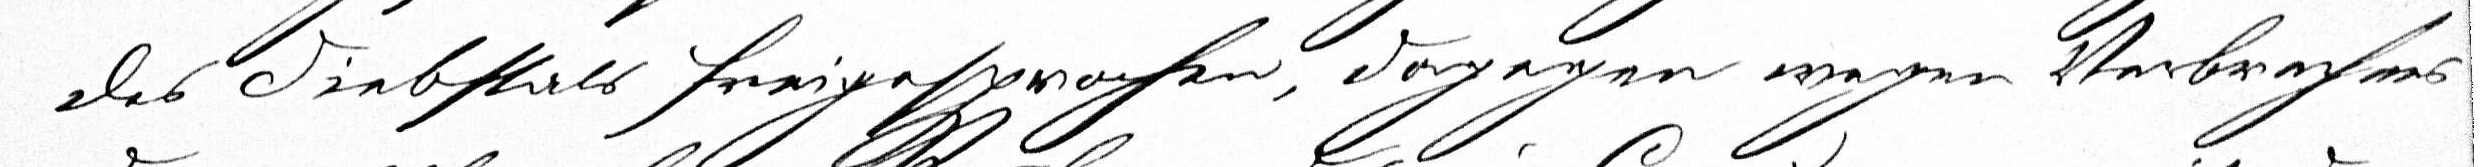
des Diebstals freigesprochen, dagegen wegen Verbrechens
